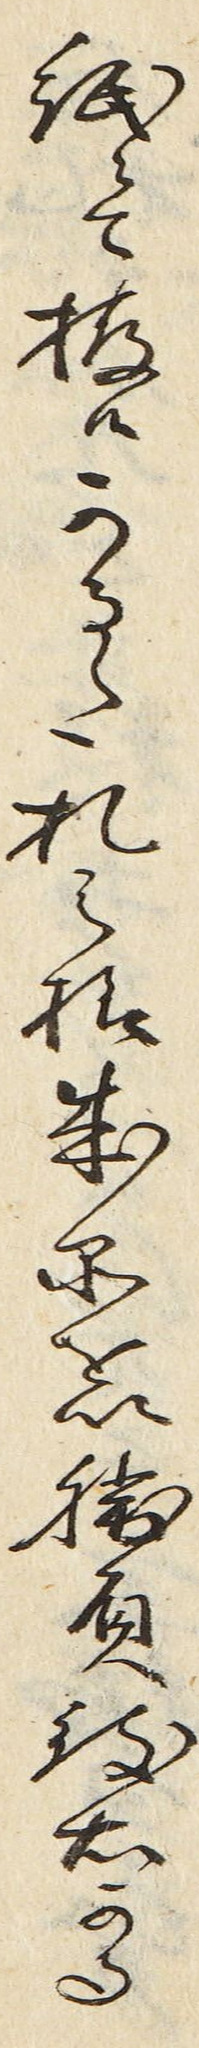紙にて拵候かるた札之様成品を以勝負致右かる

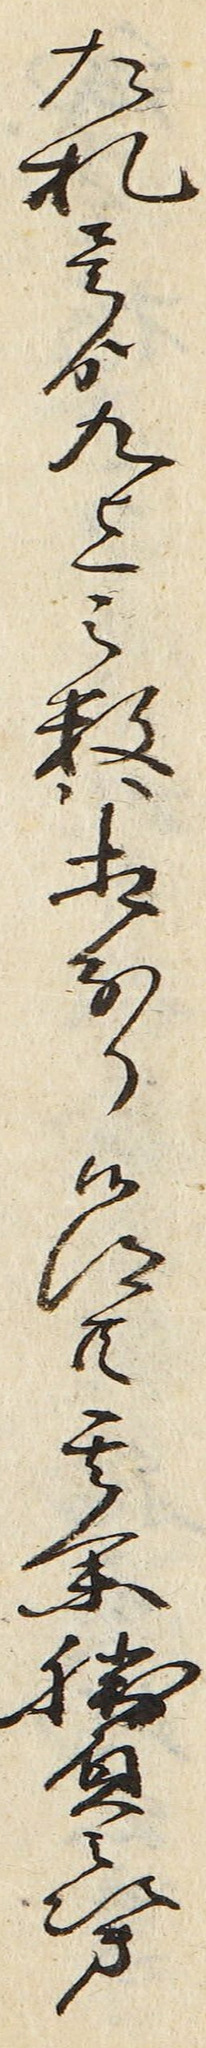た札壱ゟ九迄之数は相なり候得共其余勝負之次第
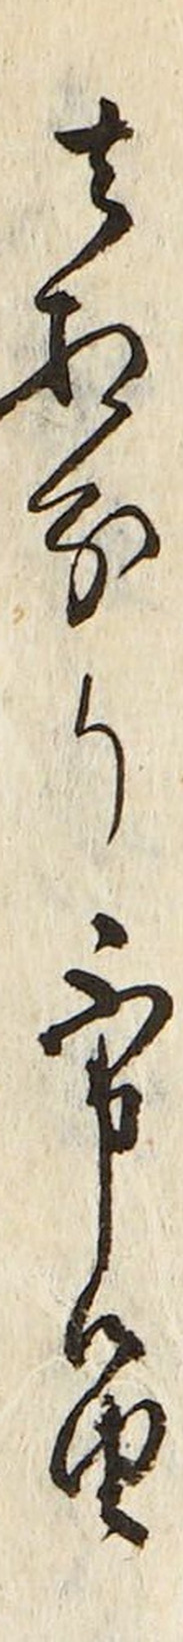は相分り不申候由
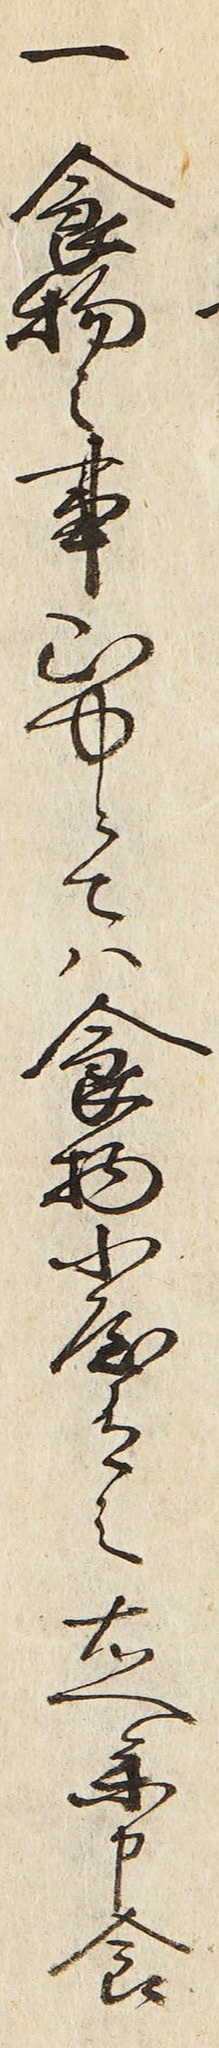一食物之事山中にては食物小屋有之右へ参申食
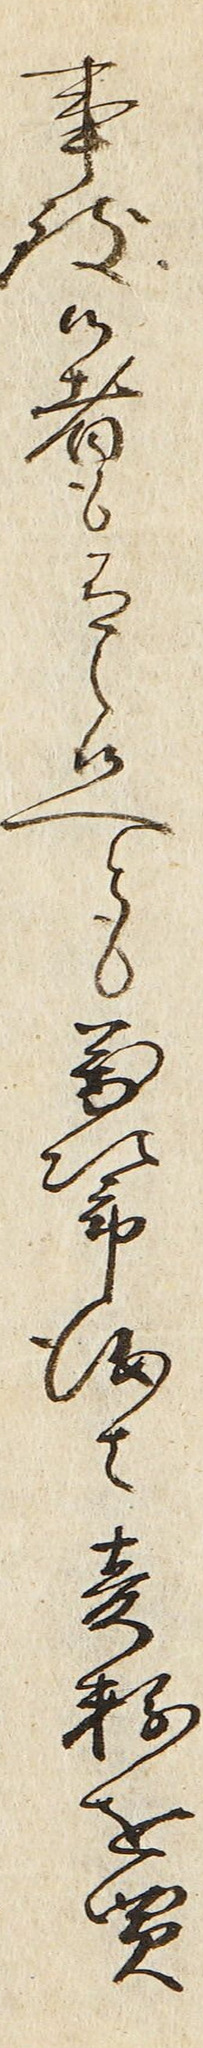事致候者も有之候へとも万次郎儀は麦粉を買
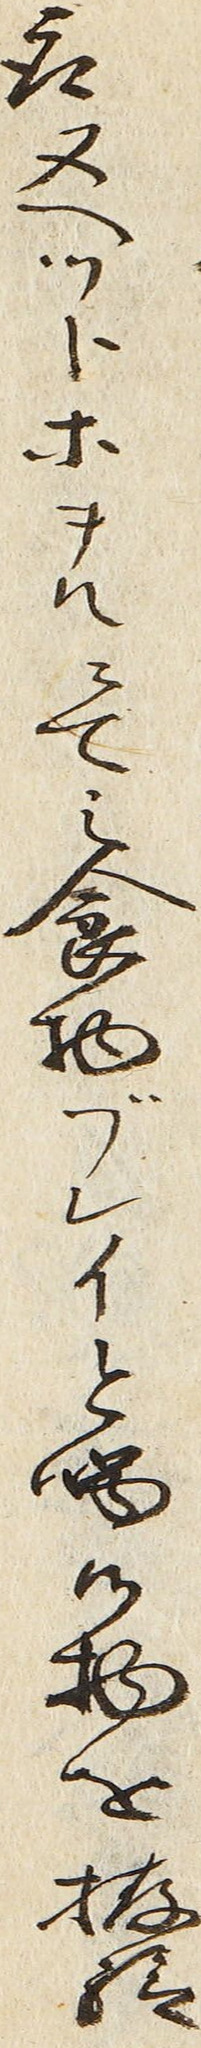取ヌヘツトホヲルにて之食物ブレイと唱候物を拵給
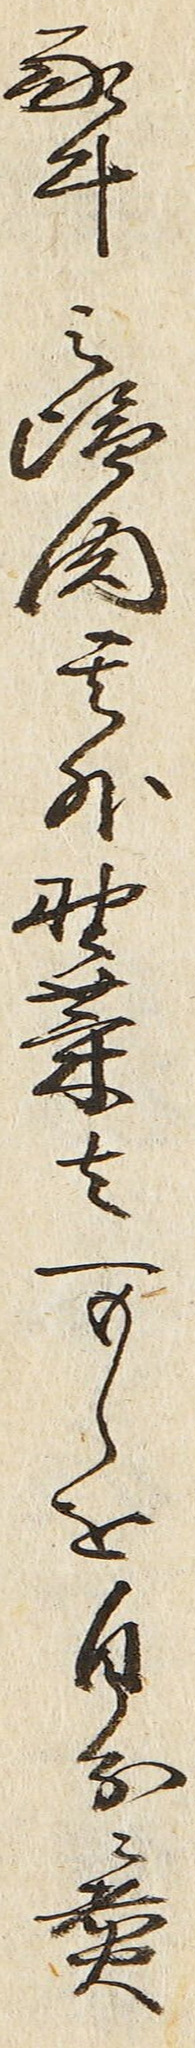豕牛之塩肉其外野菜は一もしを自分に煮
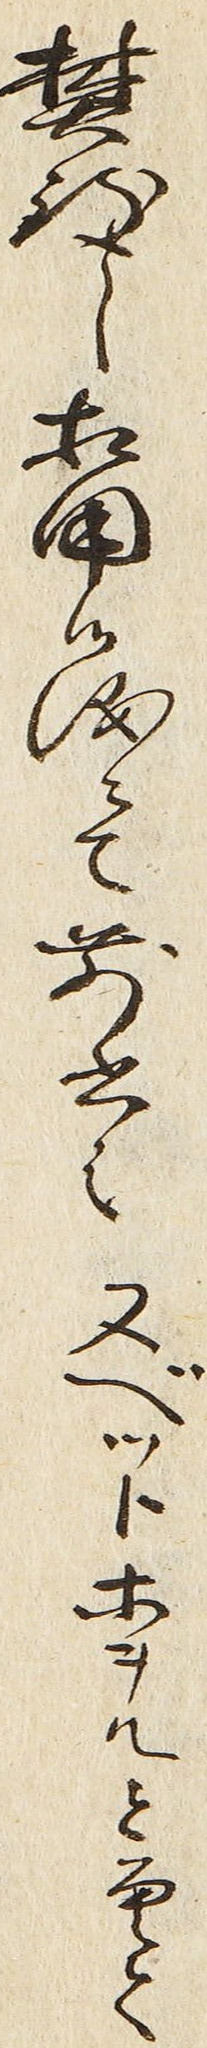焚致し相用候儀にて前書之ヌベツトホヲルと差て
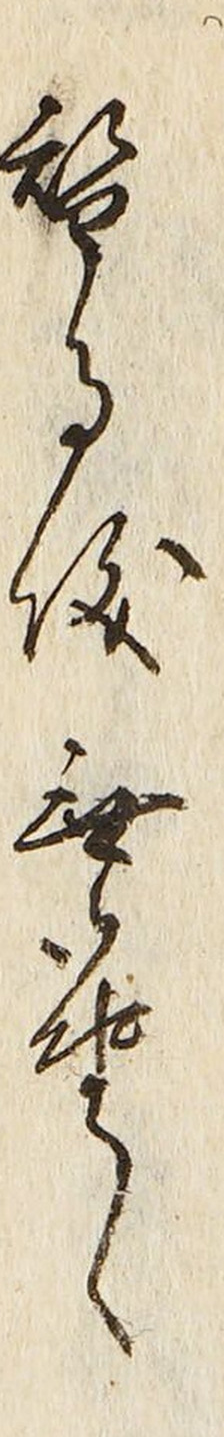替る儀無御座候
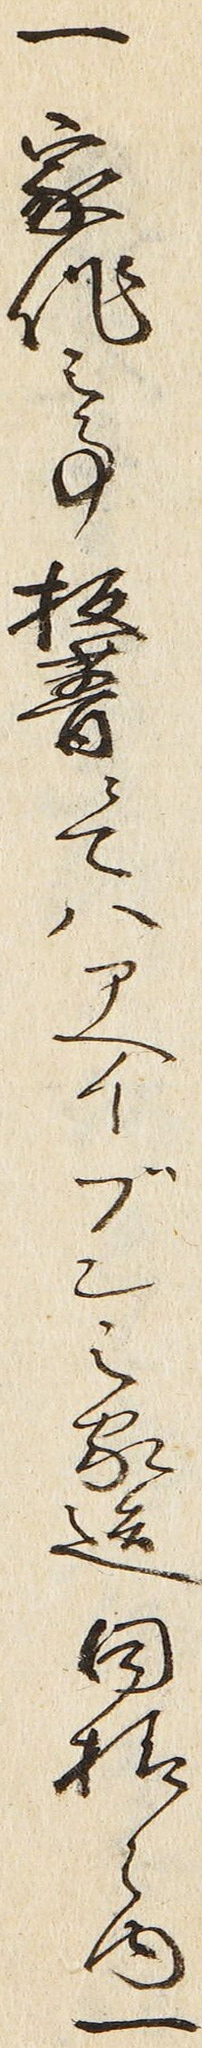一家作之事板葺にてハアヘイブン之家造同様之内一
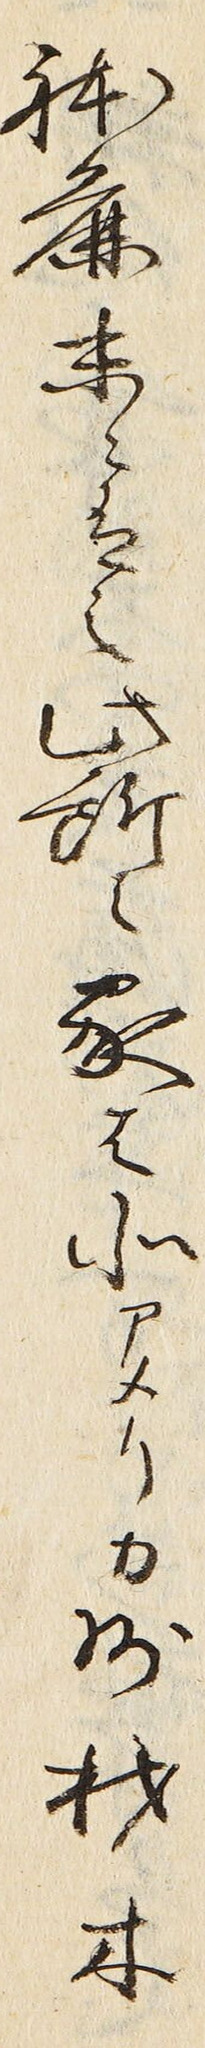躰麁末に有之此所之家は北アメリカ州材木
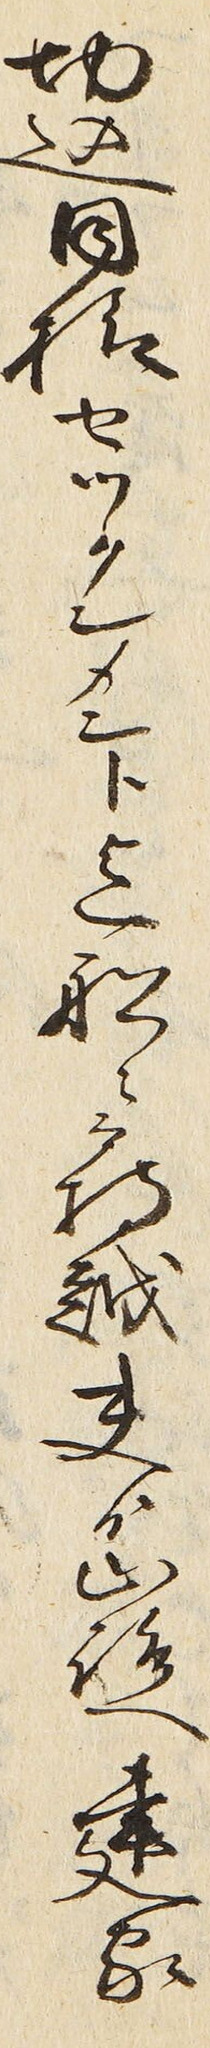切込同様セツクンメント迄船に而持越夫ゟ山路へ建家
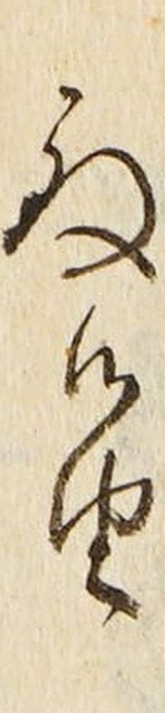致候由
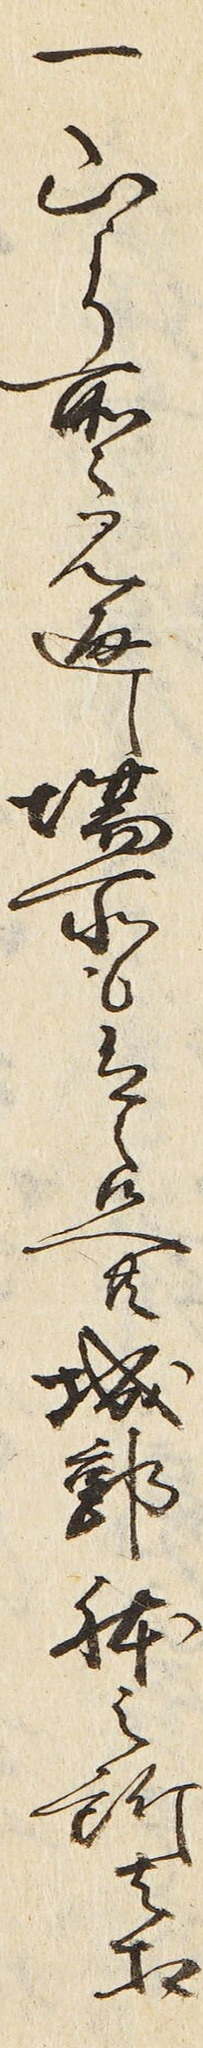一山より所々見通し場所も有之候へ共城郭躰之所は相
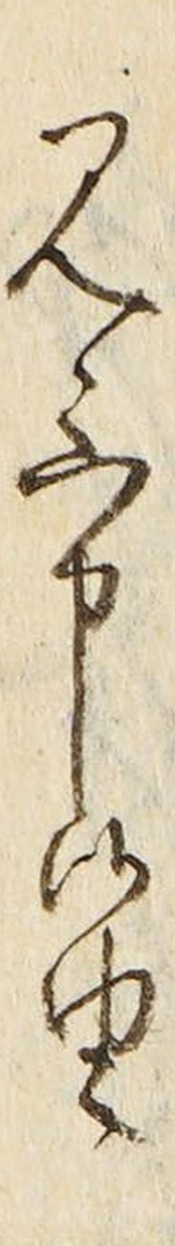見不申候由
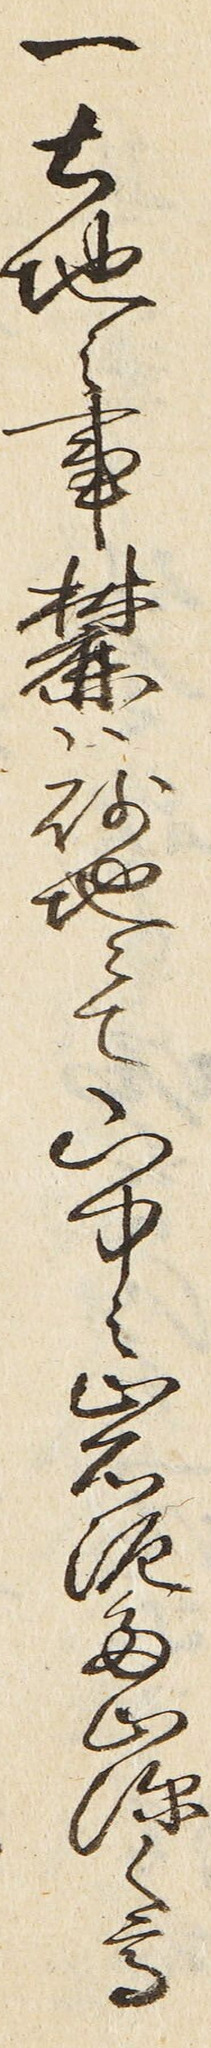一土地之事麓は砂地にて山中之岩泥多山深く高
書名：土佐中浜万次郎漂流記
